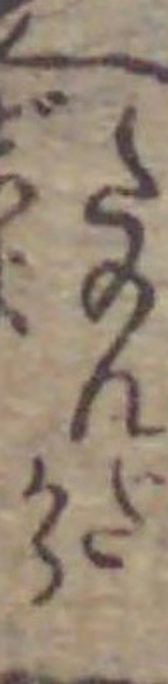たのんだ
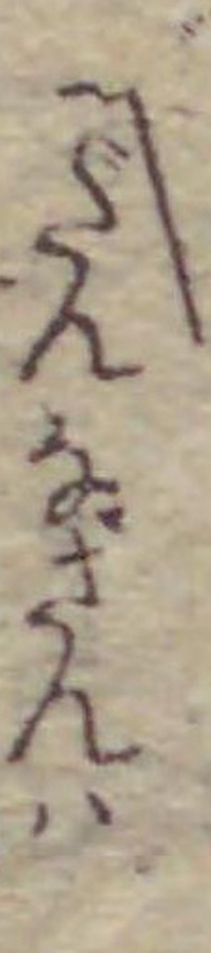〽だんなさんは
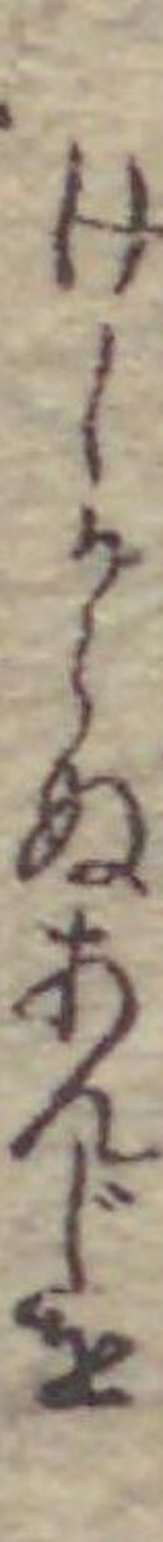けしからぬあんじを
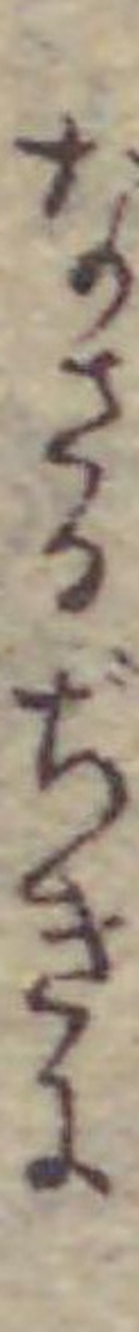なさるぢきに
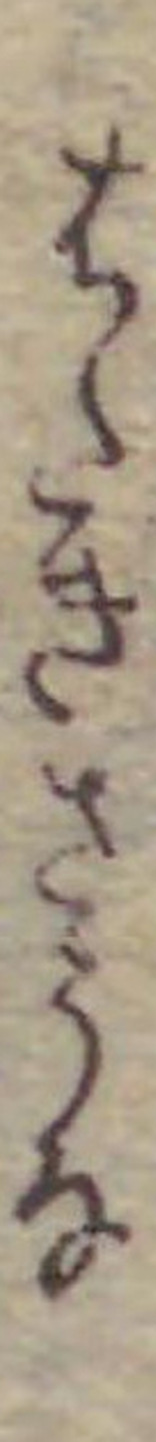はたきさうな
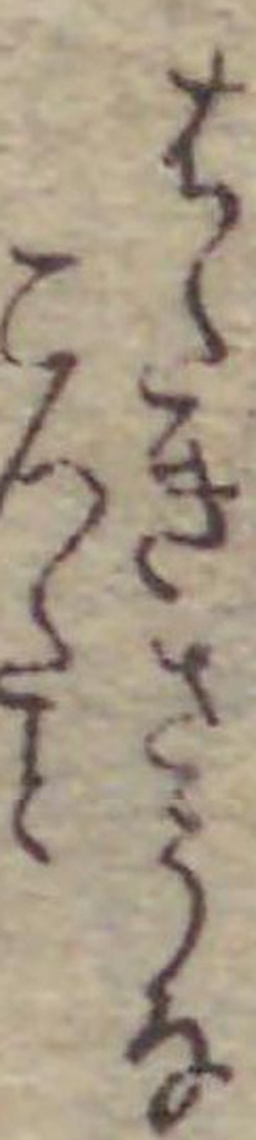こつたと
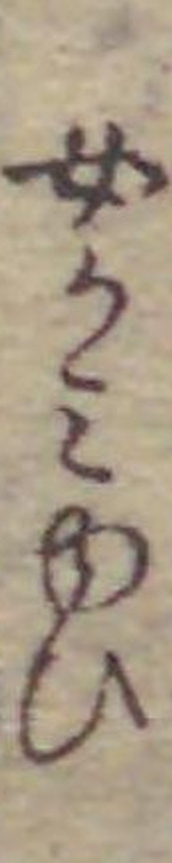女かみゆひ
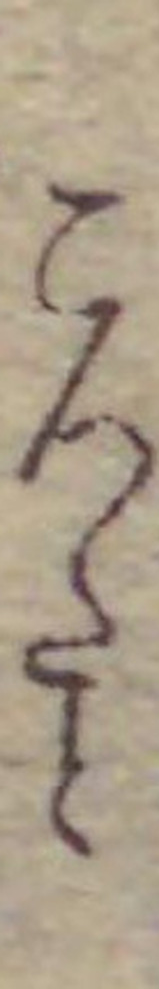こつたと
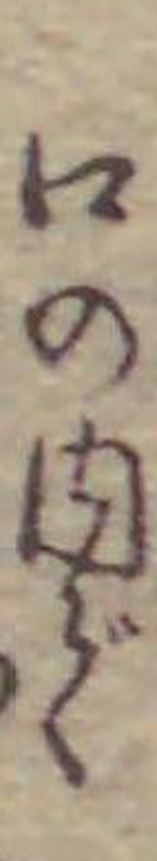口の内で

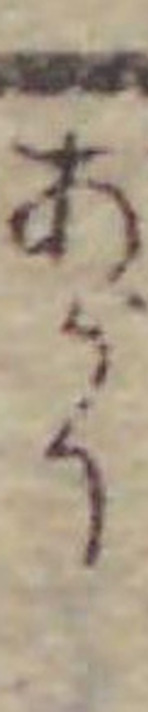あがり
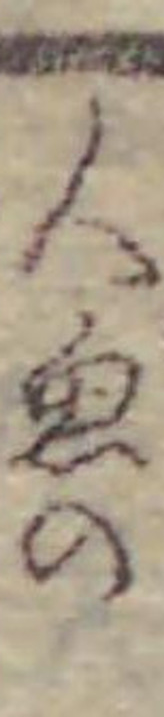人魚の
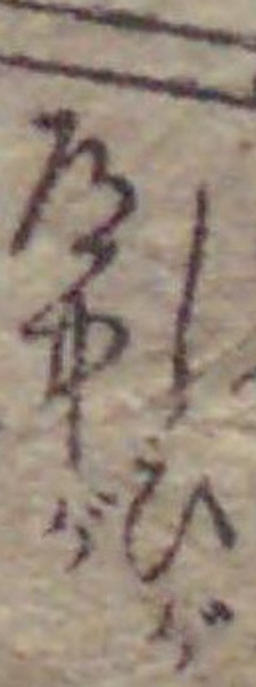道中が
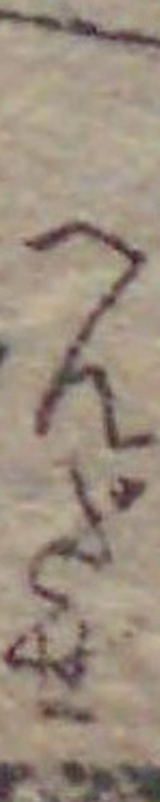へんだせ
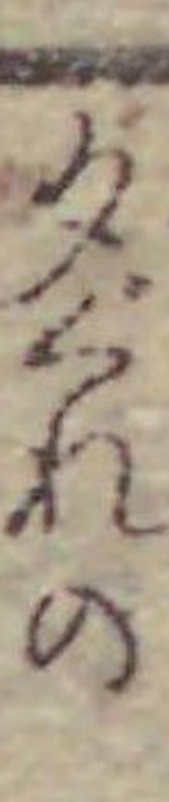夕ぐれの
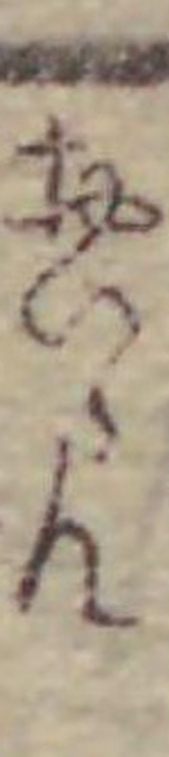おいらん
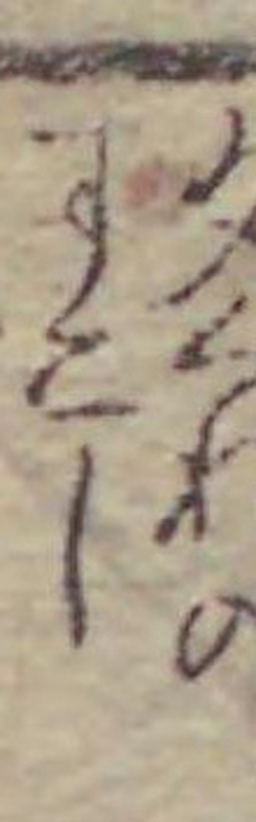すこし
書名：箱入娘面屋人魚 3巻
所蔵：国立国会図書館 National Diet Library, JAPAN
